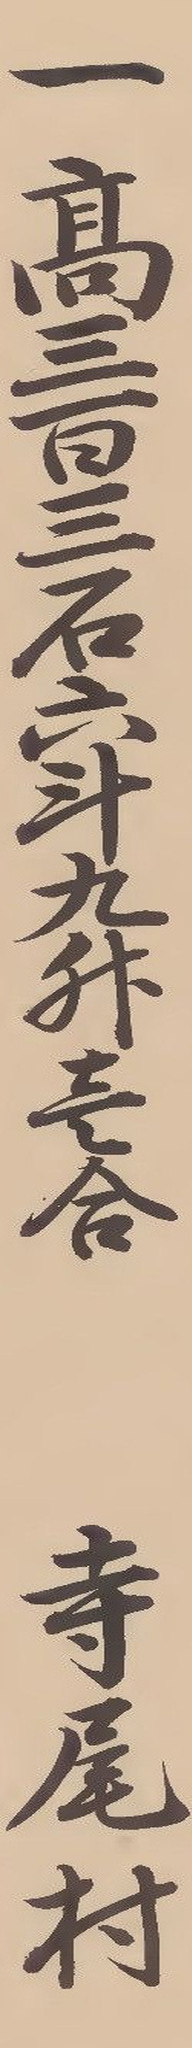一高三百三石六斗九升壱合寺尾村
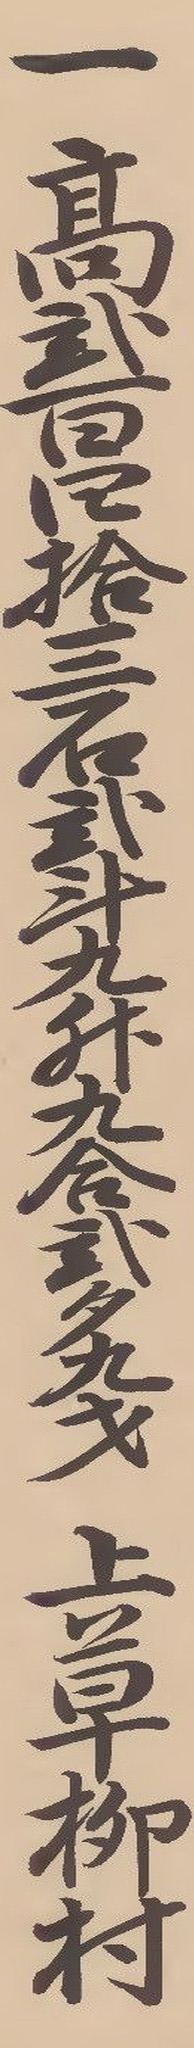一高弐百四拾三石弐斗九升九合弐勺九才上草柳村

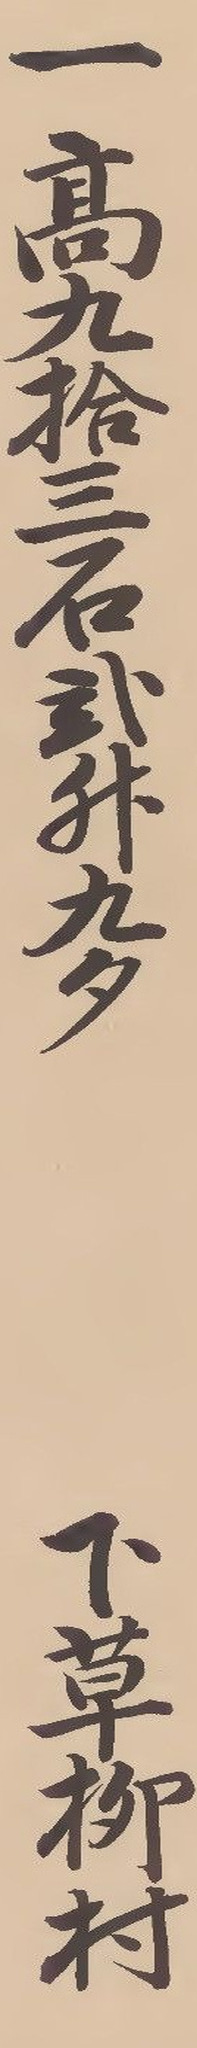一高九拾三石弐升九勺下草柳村
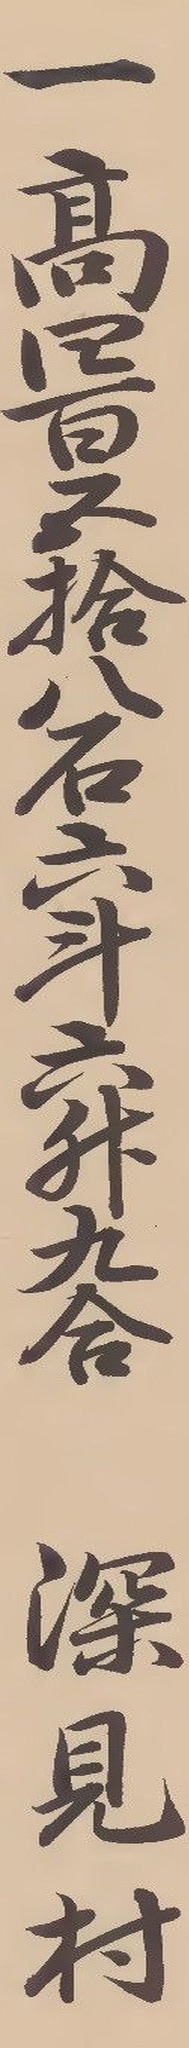一高四百五拾八石六斗六升九合深見村
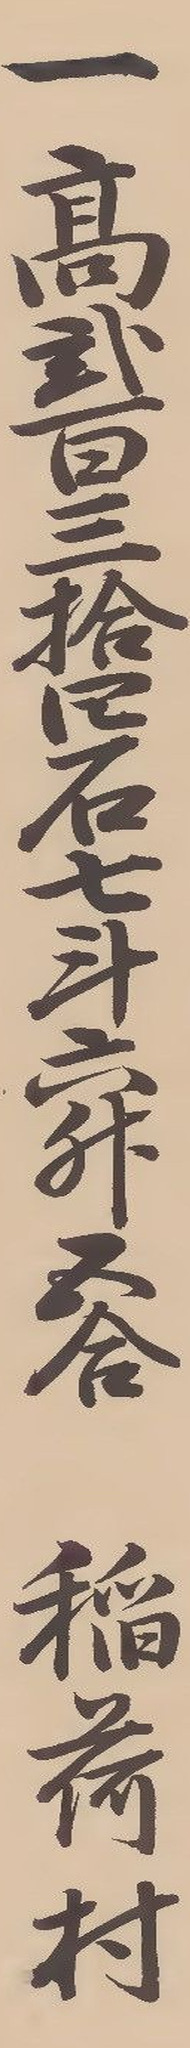一高弐百三拾四石七斗六升五合稲荷村
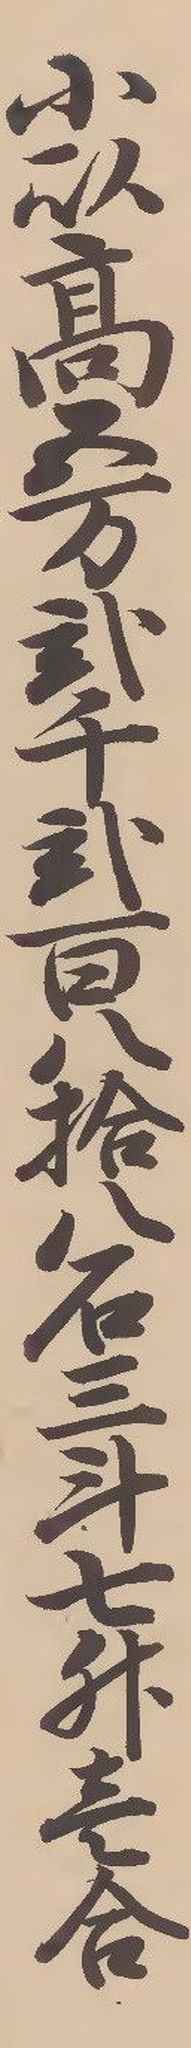小以高五万弐千弐百八拾八石三斗七升壱合

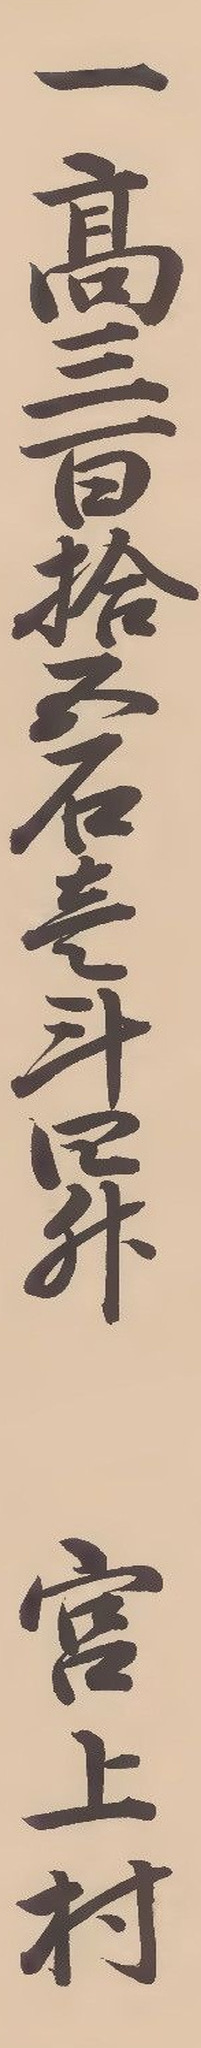一高三百拾五石壱斗四升宮上村
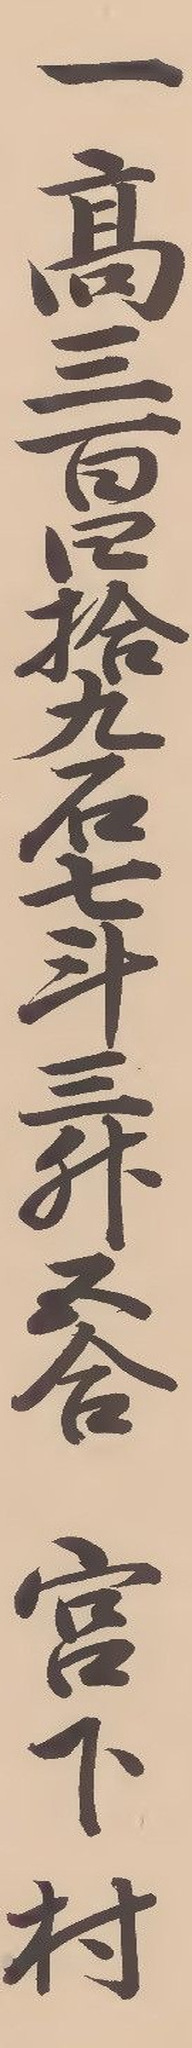一高三百四拾九石七斗三升五合宮下村
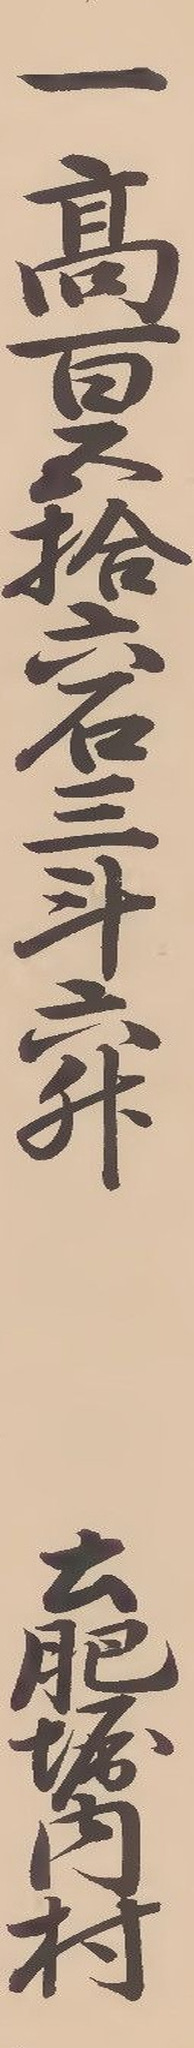一高百五拾六石三斗六升土肥堀内村
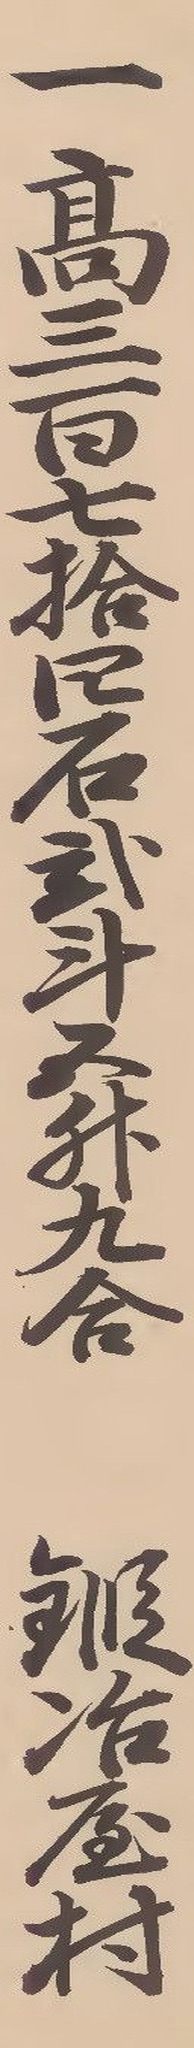一高三百七拾四石弐斗五升九合鍛冶屋村
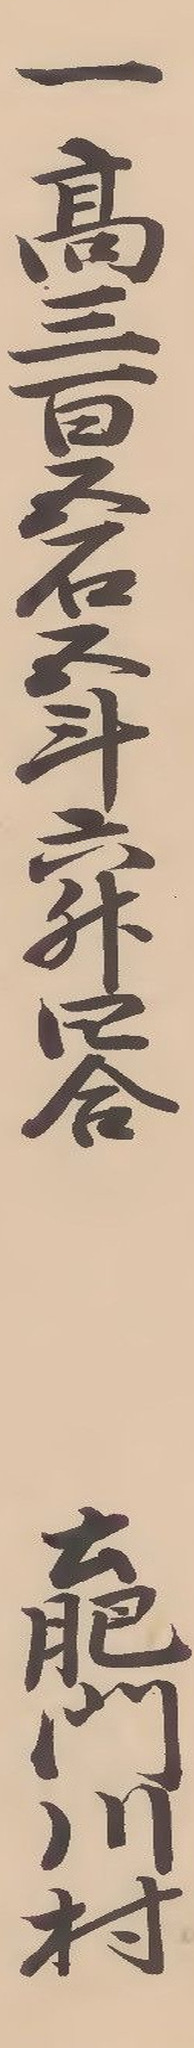一高三百五石五斗六升四合土肥門川村
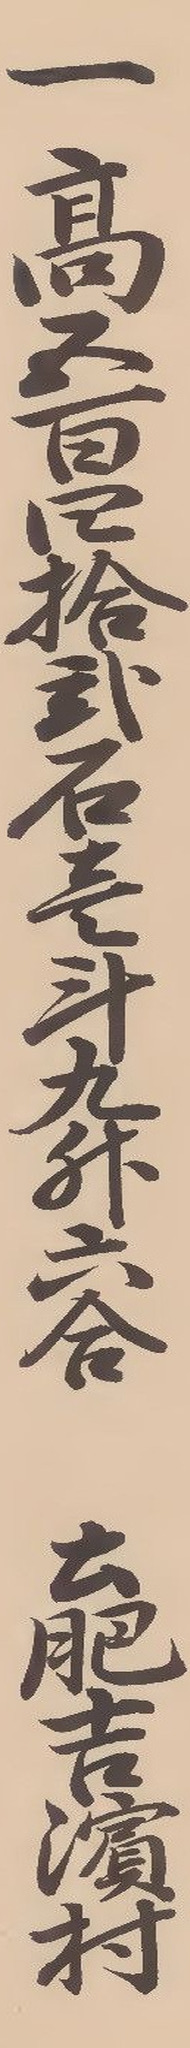一高五百四拾弐石壱斗九升六合土肥吉濱村
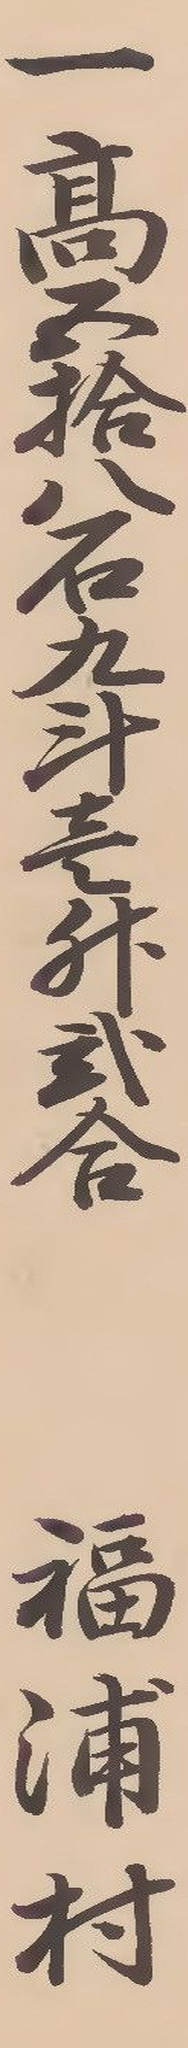一高五拾八石九斗壱升弐合福浦村

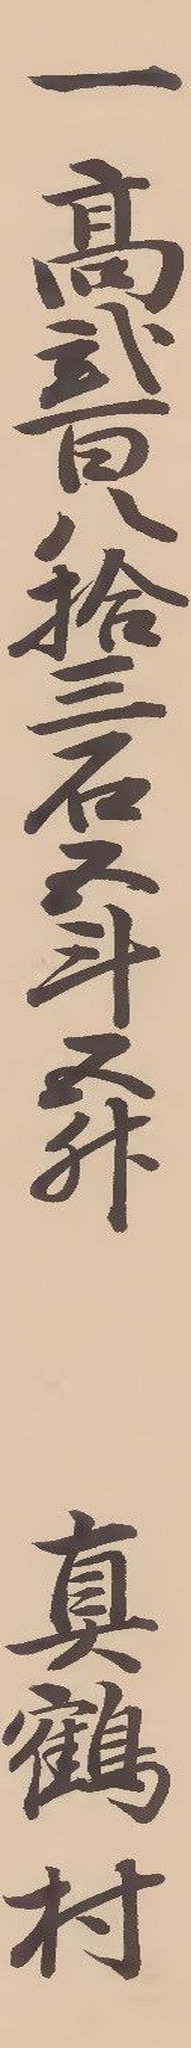一高弐百八拾三石五斗五升真鶴村
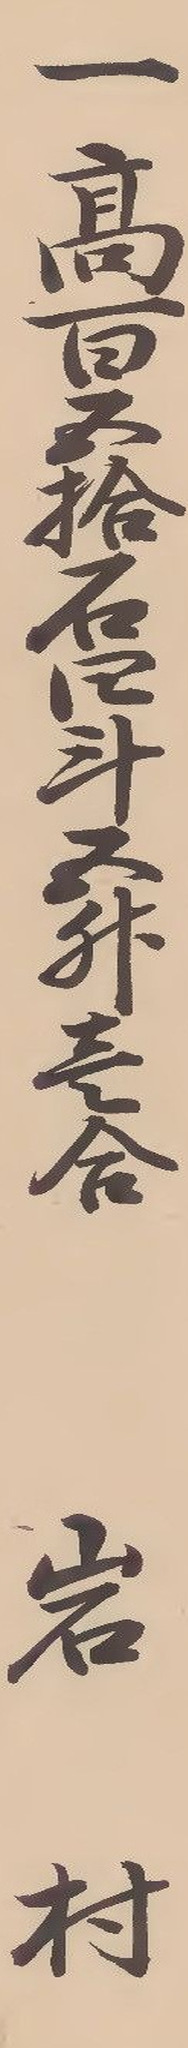一高百五拾石四斗五升壱合岩村
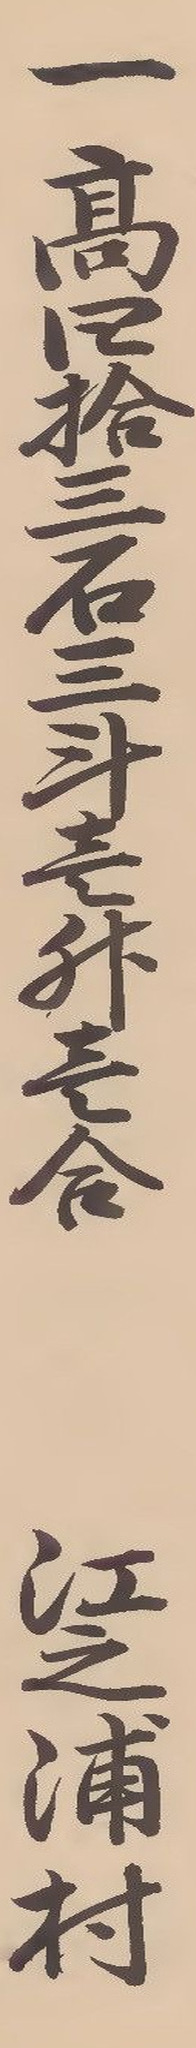一高四拾三石三斗壱升壱合江之浦村
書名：相模国郷帳
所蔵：国立公文書館 National Archives of Japan
